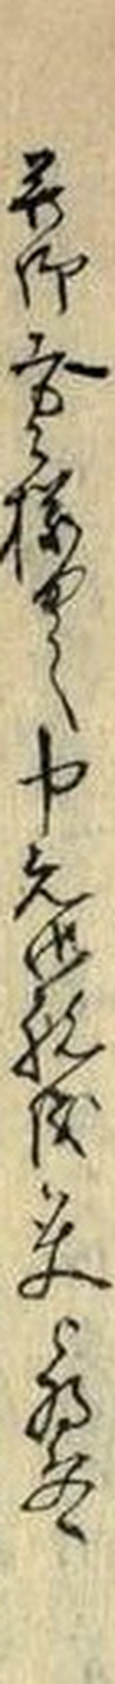并御方々様ゟ之中元御祝儀御使被為受候
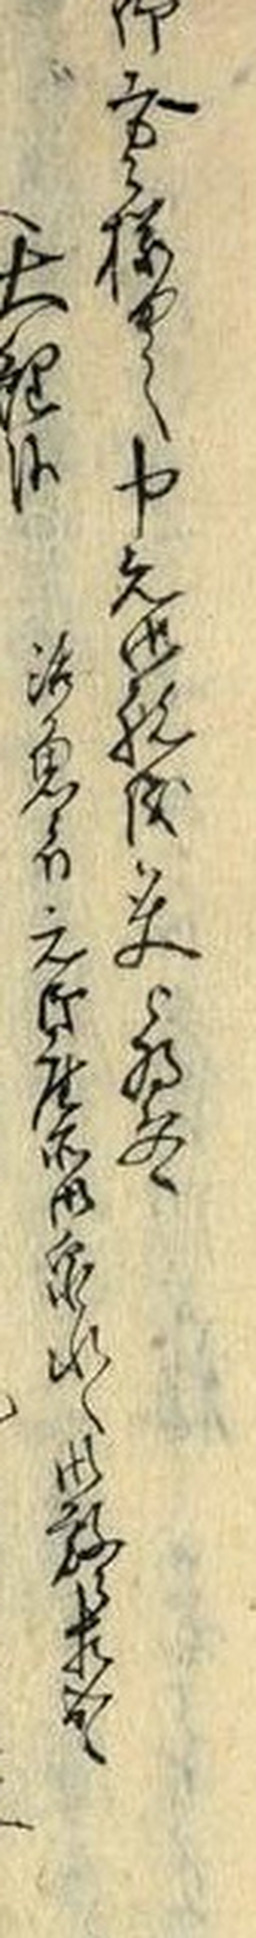大鯉弐活魚ニ付元御座所御泉水へ御放ニ相成候
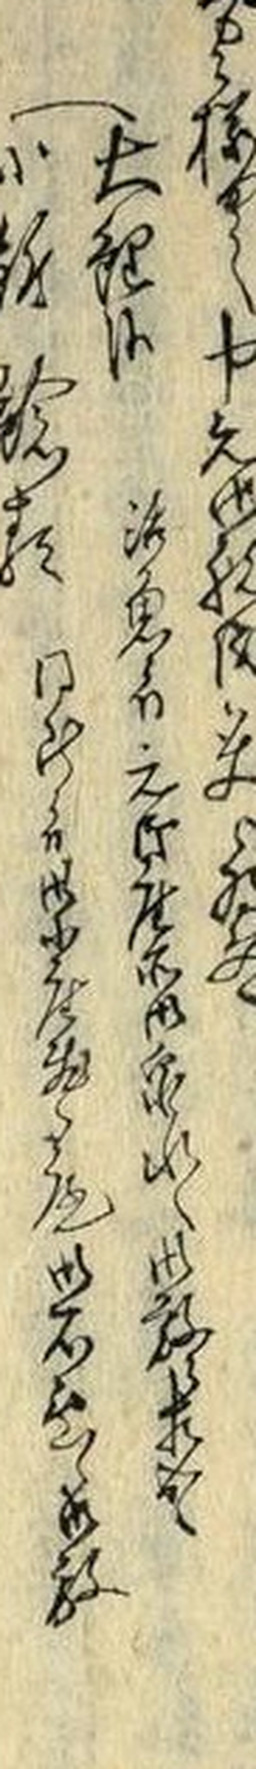小鮒鯰類同断ニ付御小座敷御庭御石泉へ御放
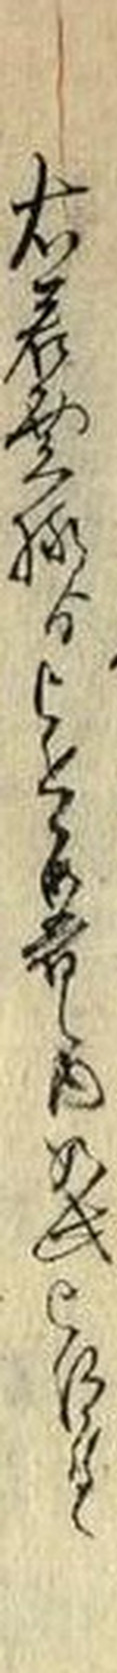右若殿様ゟ被進候御肴之内如此被仰付候
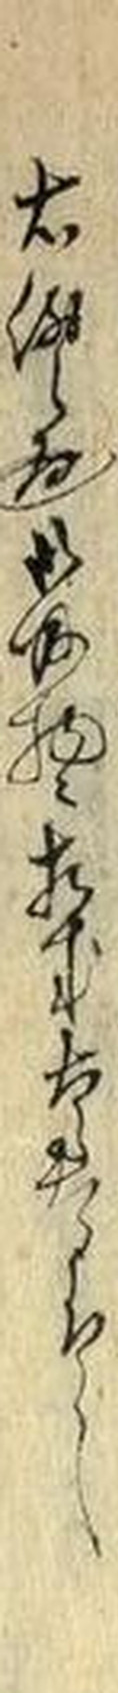右例之通御吸物ニ相成大奥被下之
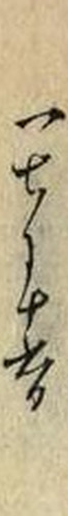一七月十六日
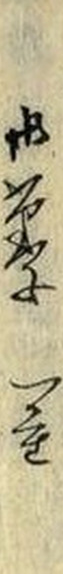御菓子一重
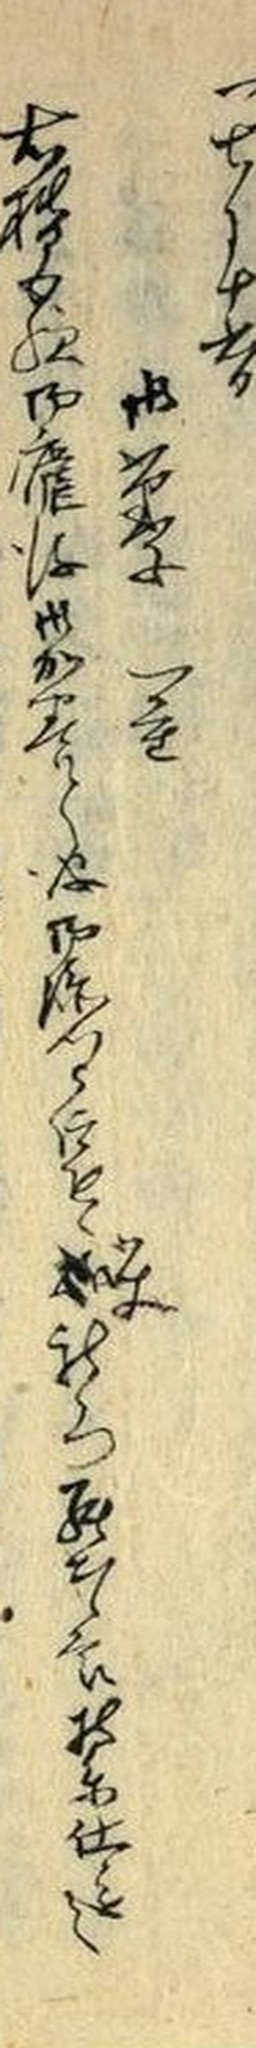右揩五郎様御瘧後御加養之儀御添以被仰進候御使新右衛門罷出候節持参仕被進之
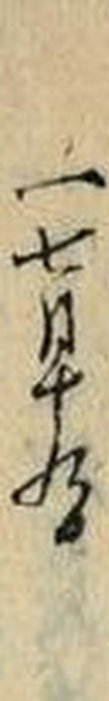一七月十九日
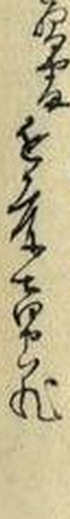近藤勇蔵
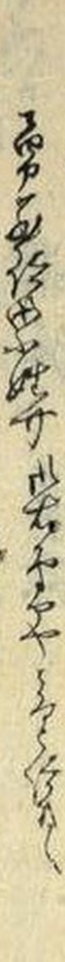勇蔵跡御小姓介御右筆部やニ而仰付之
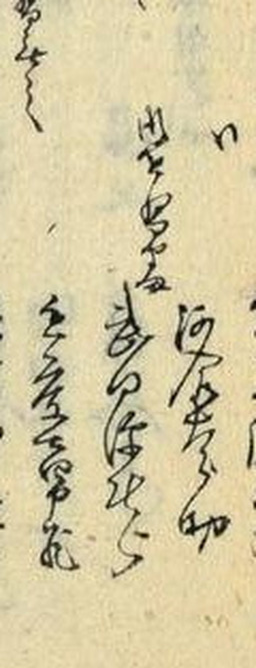御近習番武田源次郎
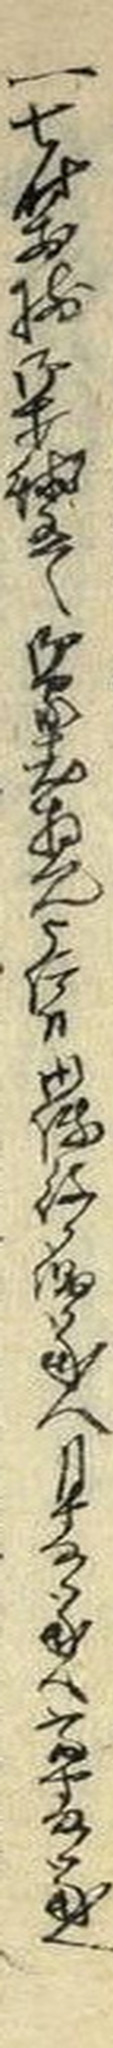一七時前揃御打毬有之御家老拝見被仰付御側役御側御用人月番御用人当番御用人
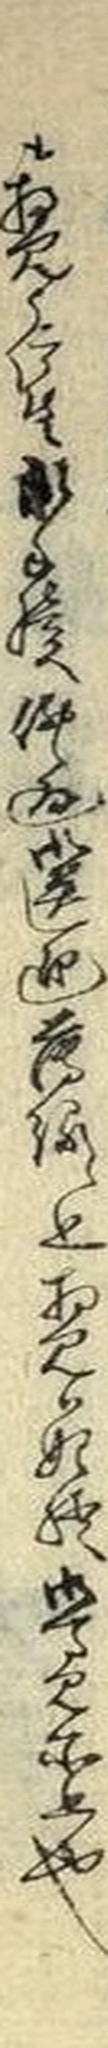も拝見被仰付候御手続例之通御送迎薄縁之上拝見御始終御馬見所上也
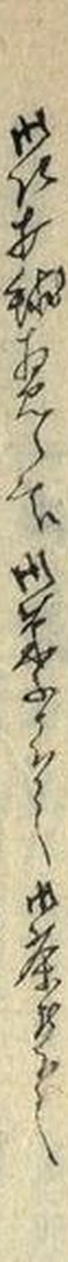御次打毬拝見之節御菓子被下之御茶被下之
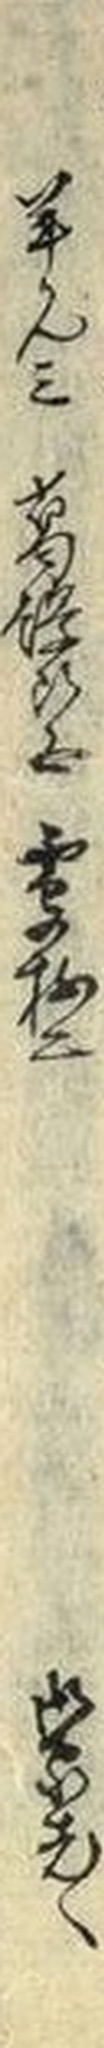羊かん三葛饅頭五雪の梅二御家老へ
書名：少傅日録抄（斉承付側向頭取日記、在国）
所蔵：福井県文書館 Fukui Prefectural Archives
